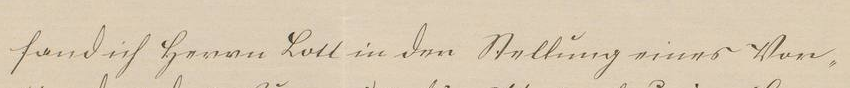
fand ich Herrn Lott in der Stellung eines Vor-
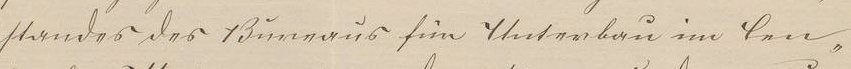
standes des Bureaus für Unterbau im Cen-
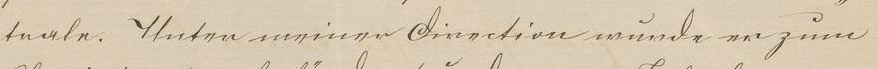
trale. Unter meiner Direction wurde er zum
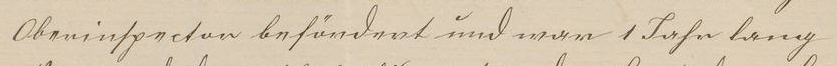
Oberinspector befördert und war 1 Jahr lang
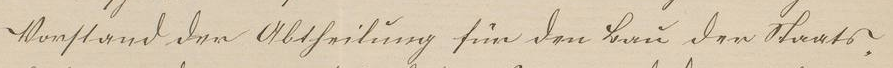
Vorstand der Abtheilung für den Bau der Staats-
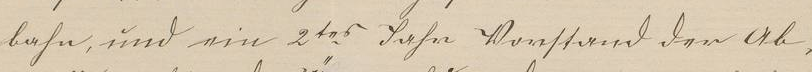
bahn, und ein 2tes Jahr Vorstand der Ab-
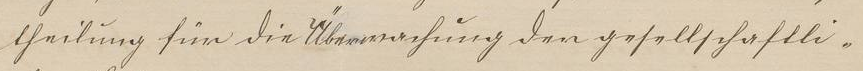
theilung für die Überwachung der gesellschaftli-
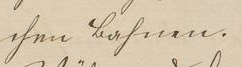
chen Bahnen.
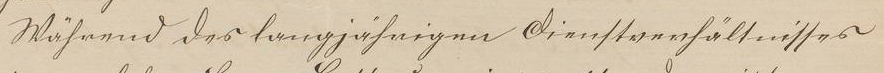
Während des langjährigen Dienstverhältnisses
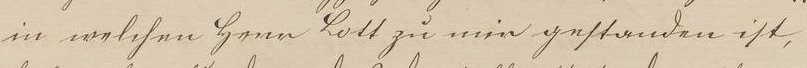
in welchen Herr Lott zu mir gestanden ist,
